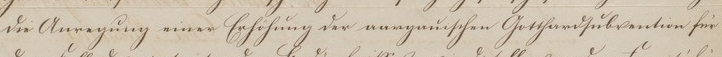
die Anregung einer Erhöhung der aargauischenGotthardsubvention für
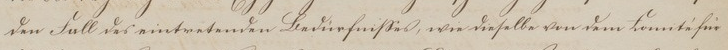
den Fall des eintretenden Bedürfnißes, wie dieselbe von dem Comité für
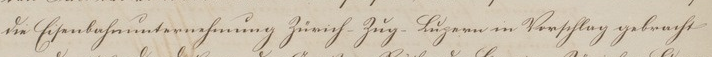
die Eisenbahnunternehmung Zürich–Zug–Luzern in Vorschlag gebracht
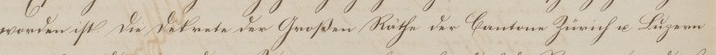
worden ist. Die Dekrete der Großen Räthe der Cantone Zürich & Luzern
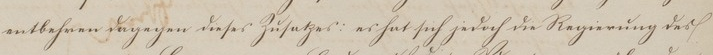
entbehren dagegen dieses Zusatzes: es hat sich jedoch die Regierung des
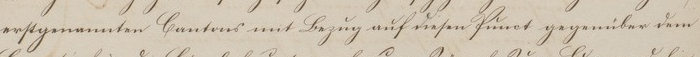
erstgenannten Cantons mit Bezug auf diesen Punct gegenüber dem
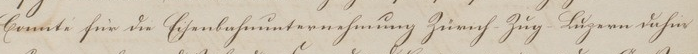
Comité für die Eisenbahnunternehmung Zürich–Zug–Luzern dahin
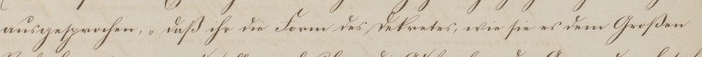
ausgesprochen, «daß ihr die Form des Dekretes, wie sie es dem Großen
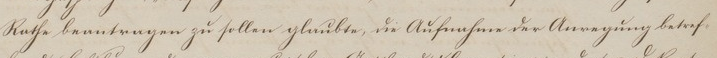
Rathe beantragen zu sollen glaubte, die Aufnahme der Anregung betref-
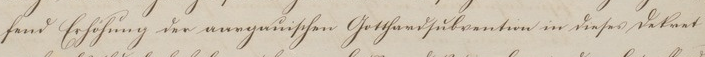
fend Erhöhung der aargauischenGotthardsubvention in dieses Dekret
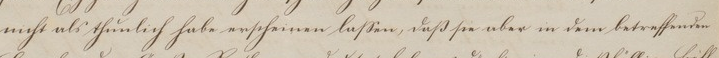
nicht als thunlich habe erscheinen laßen, daß sie aber in dem betreffenden
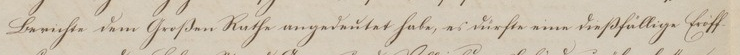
Berichte dem Großen Rathe angedeutet habe, es dürfte eine dießfällige Eröff-
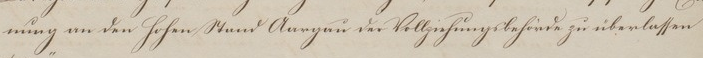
nung an den hohen Stand Aargau der Vollziehungsbehörde zu überlassen
